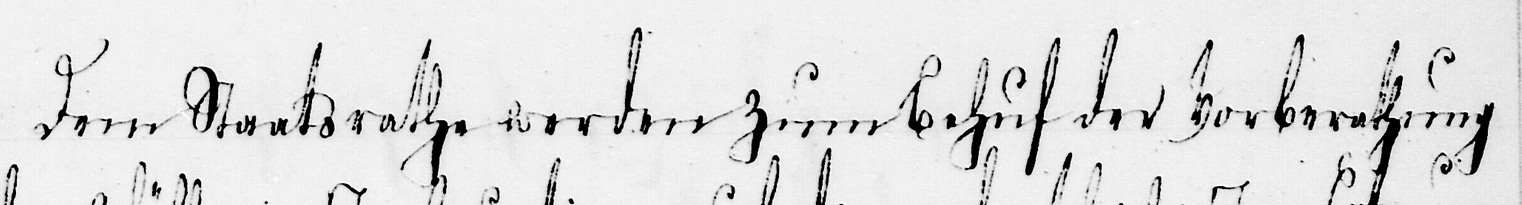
Dem Staatsrathe werden zum Behuf der Vorberathung
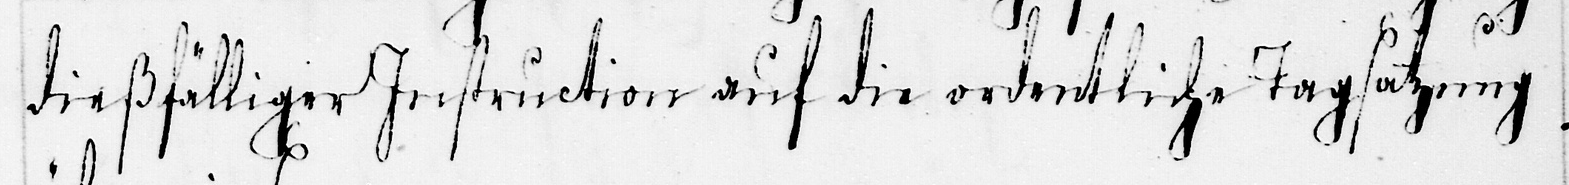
dießfälliger Instruction auf die ordentliche Tagsatzung
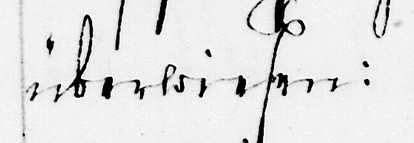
überwiesen:
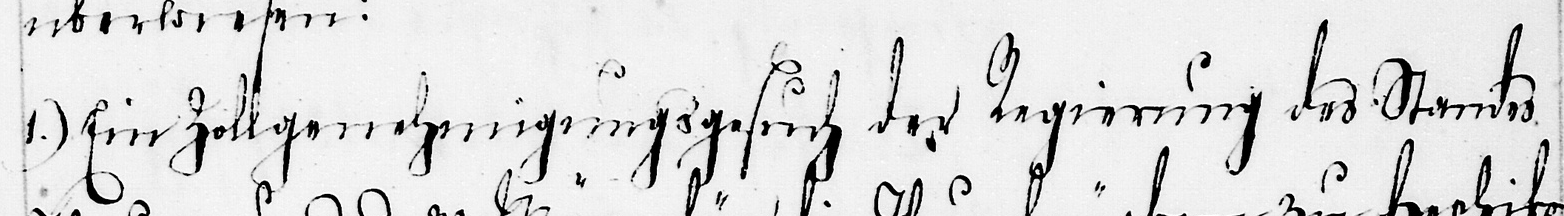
1.) Ein Zollgenehmigungsgesuch der Regierung des Standes
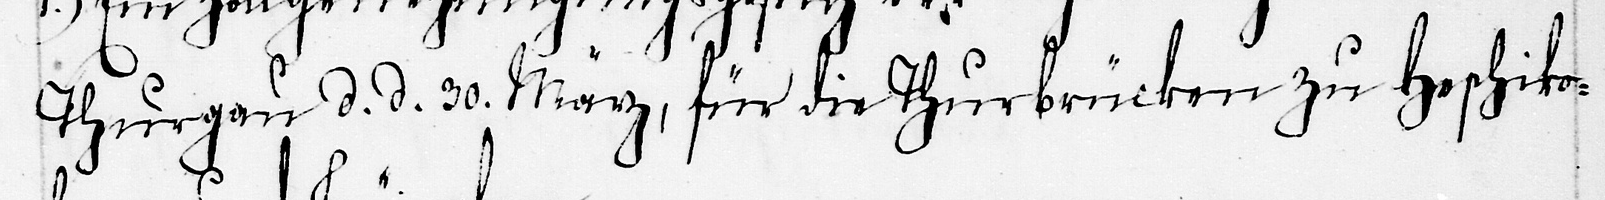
Thurgau d. d. 30. März, für die Thurbrücken zu Heschiko¬
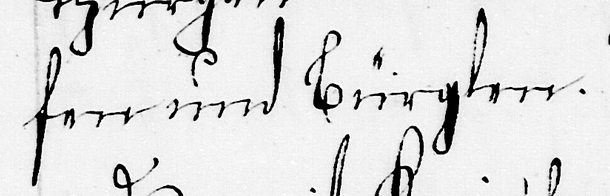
fen und Bürglen.
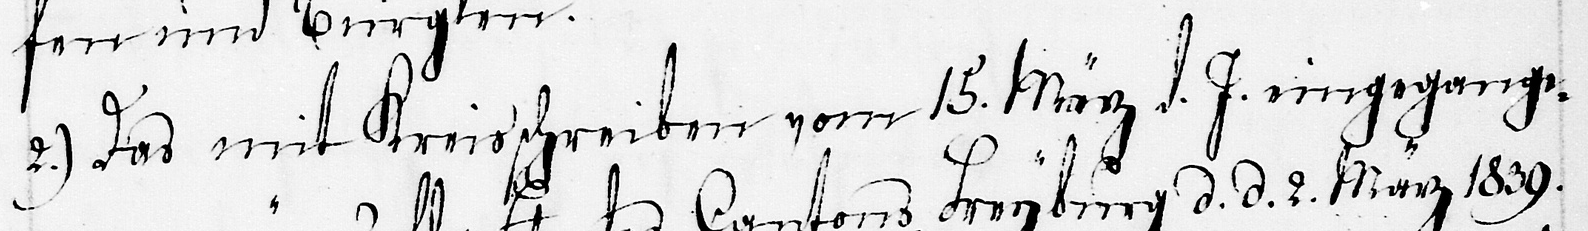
2.) Das mit Kreisschreiben vom 15. März d. J. eingegange¬
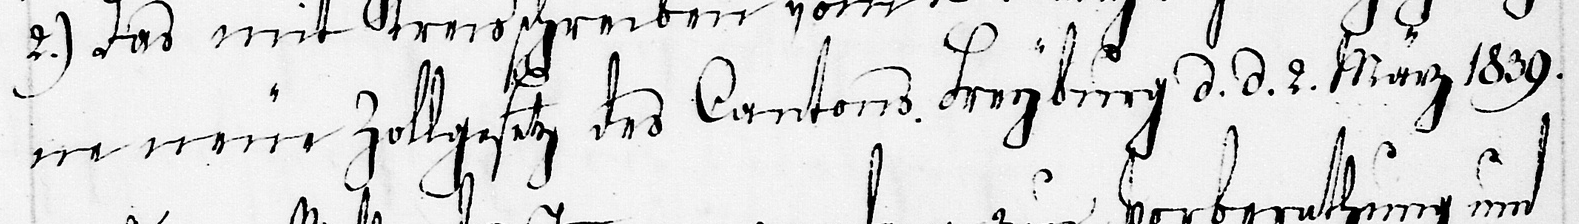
ne neue Zollgesetz des Cantons Freyburg d. d. 2. März 1839.
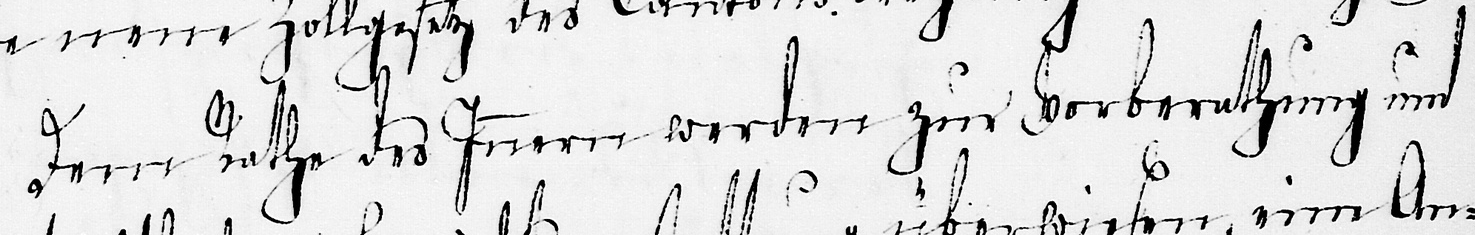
Dem Rathe des Innern werden zur Vorberathung und
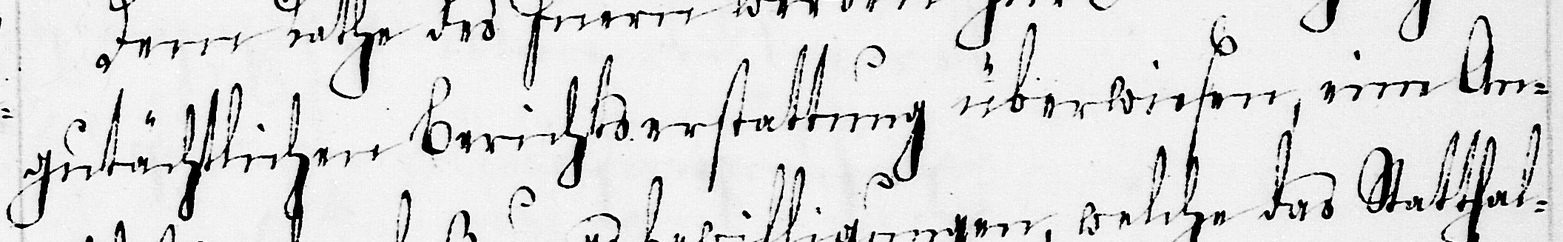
gutächtlichen Berichtserstattung überwiesen, eine An¬
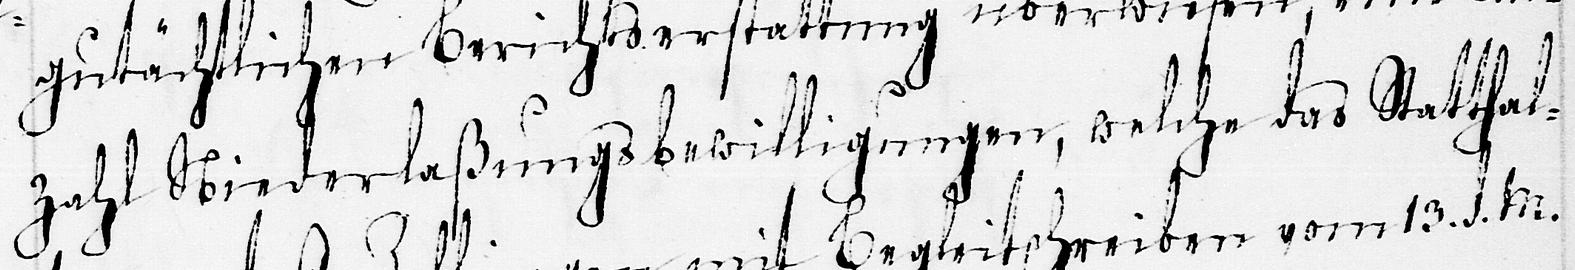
zahl Niederlaßungsbewilligungen, welche das Statthal¬
